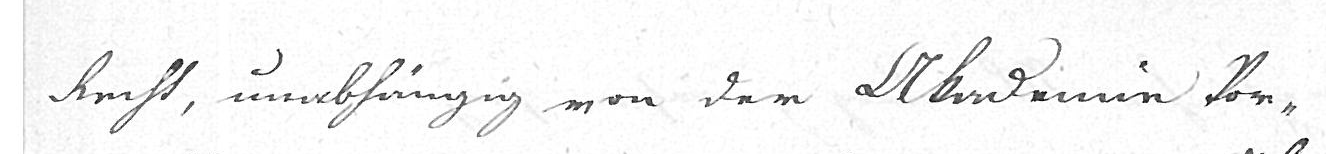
Recht, unabhängig von der Akademie Vor-
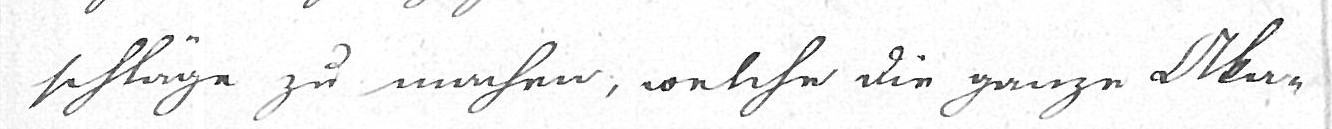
schläge zu machen, welche die ganze Aka-
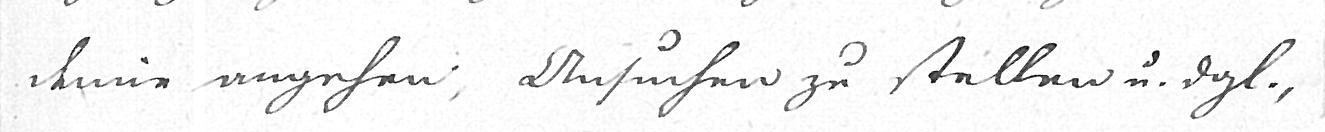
demie angehen; Ansuchen zu stellen u. dgl.,
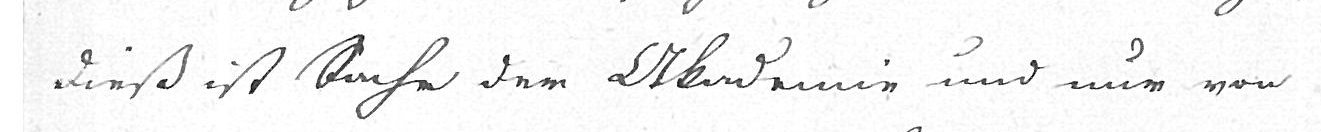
dieß ist Sache der Akademie und nur von
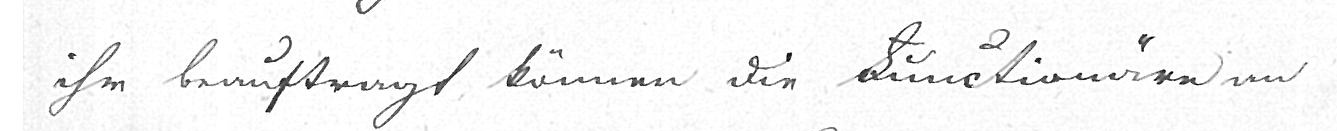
ihr beauftragt können die Functionäre an
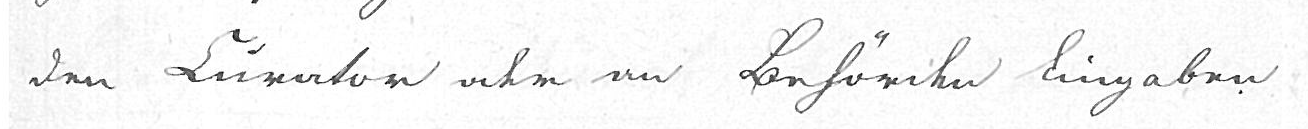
den Curator oder an Behörden Eingaben
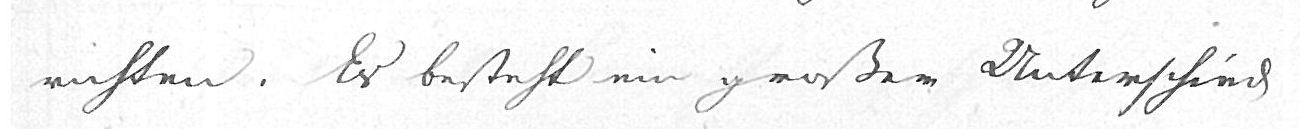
richten. Es besteht ein großer Unterschied
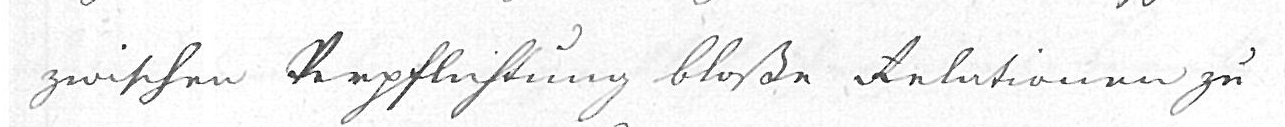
zwischen Verpflichtung, bloße Relationen zu
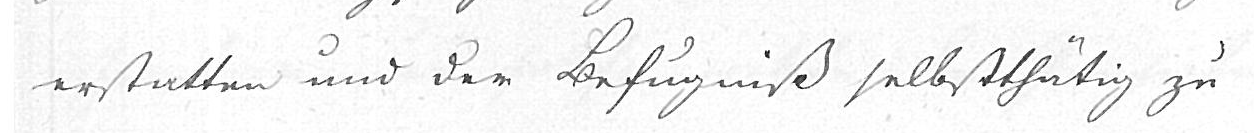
erstatten und der Befugniß selbstthätig zu
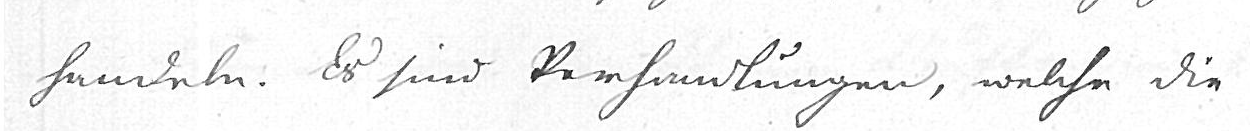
handeln. Es sind Verhandlungen, welche die
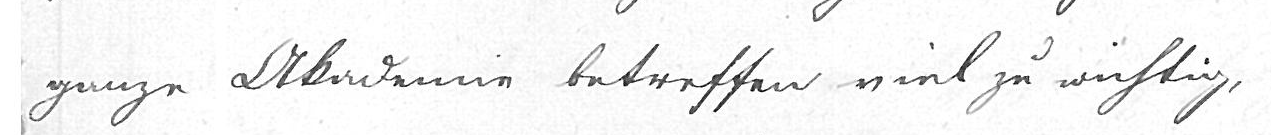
ganz Akademie betreffen viel zu wichtig,
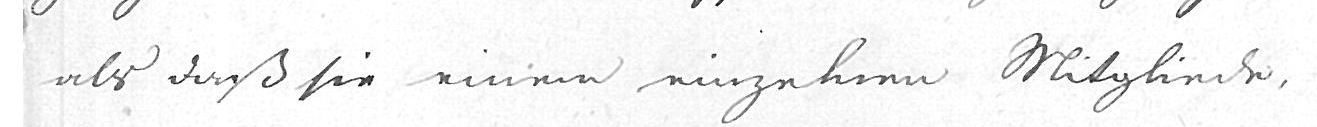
als daß sie einen einzelnen Mitgliede,
